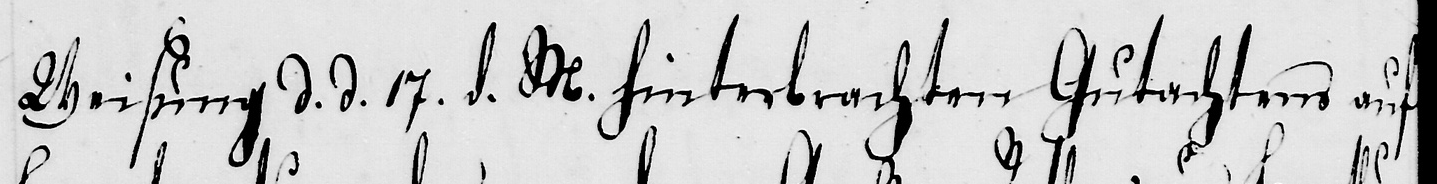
Weisung d. d. 17. d. M. hinterbrachten Gutachtens auf
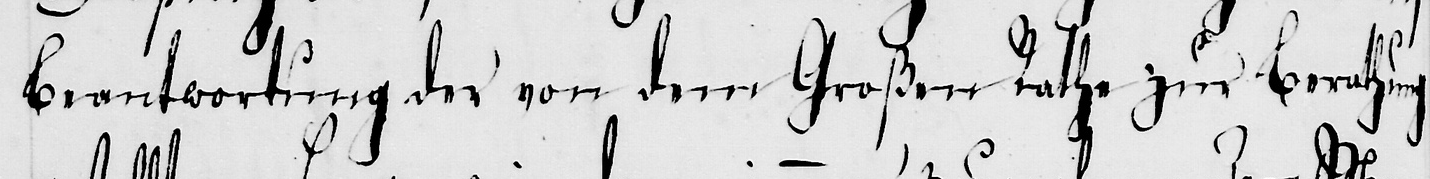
Beantwortung der von dem Großen Rathe zur Berathu¬
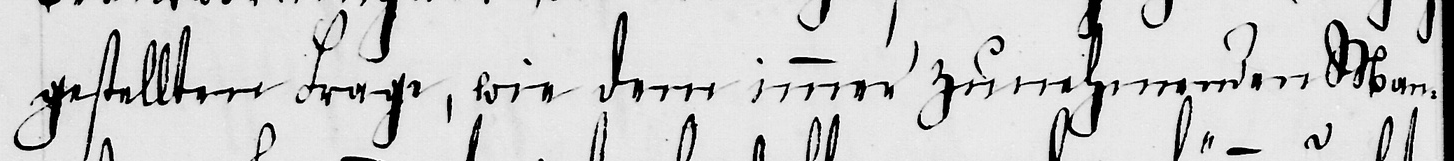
gestellten Frage, wie dem immer zunehmenden Man¬
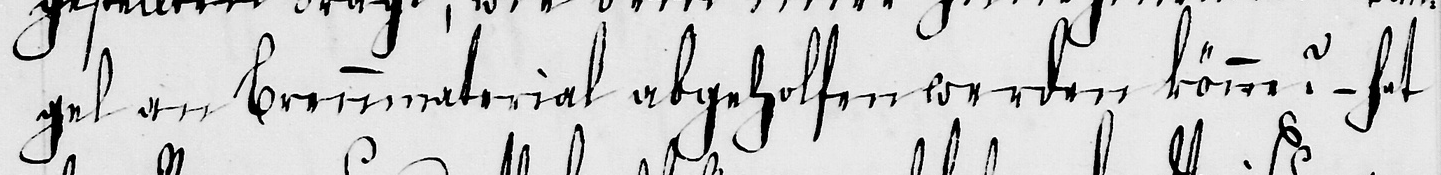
gel an Brennmaterial abgeholfen werden könne? – hat
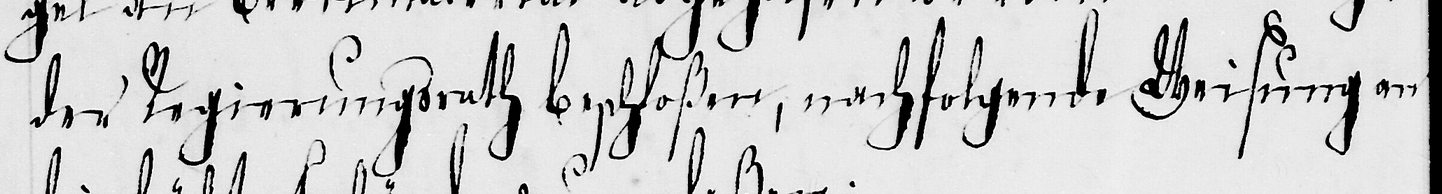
der Regierungsrath beschloßen, nachfolgende Weisung an
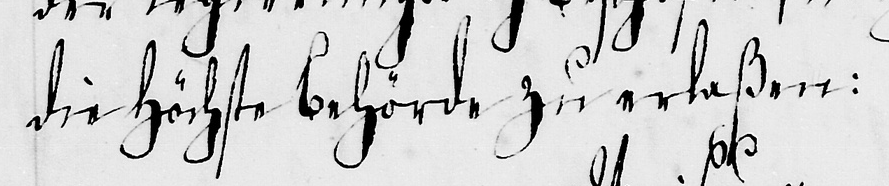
die Höchste Behörde zu erlaßen:
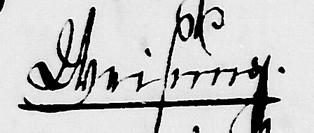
Weisung.
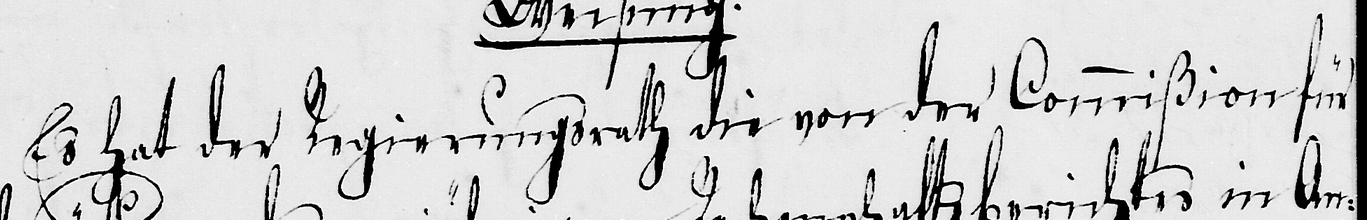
Es hat der Regierungsrath die von der Commißion für
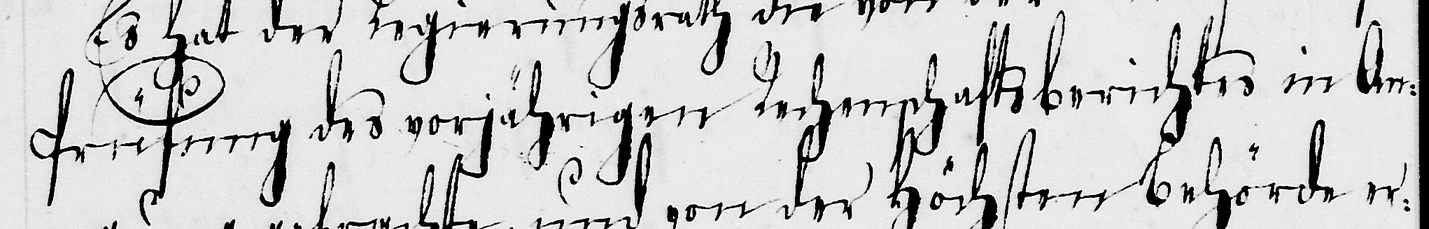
des vorjährigen Rechenschaftsberichtes in
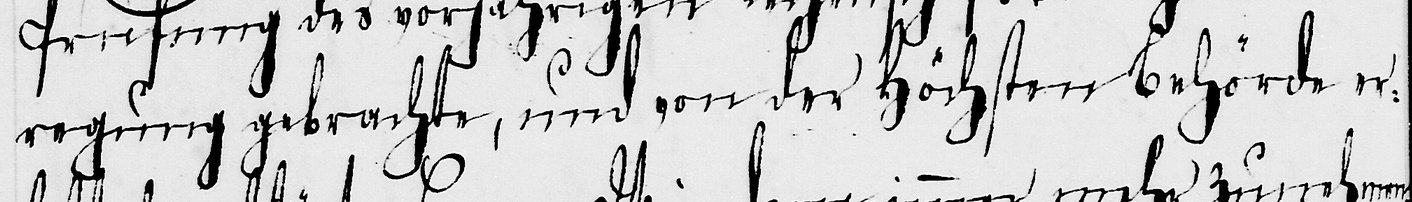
regung gebrachte, und von der Höchsten Behörde er¬
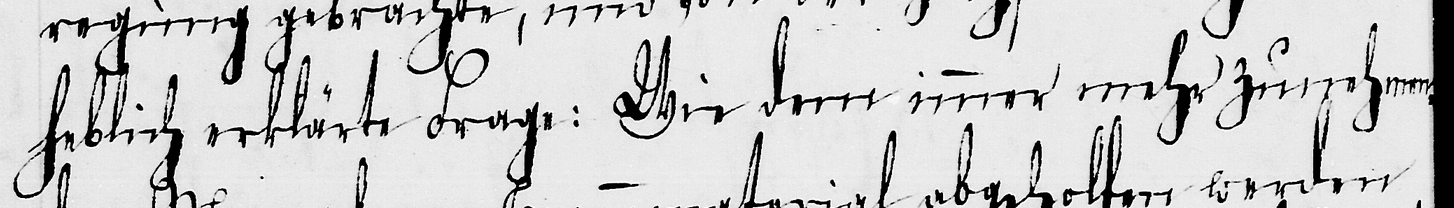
heblich erklärte Frage: Wie dem immer mehr zunehmen¬
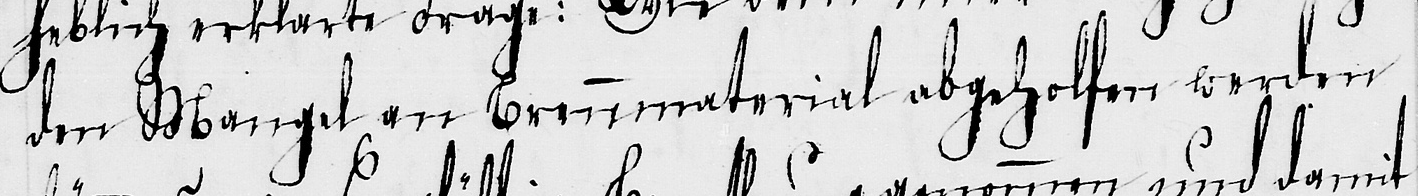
den Mangel an Brennmaterial abgeholfen werden
